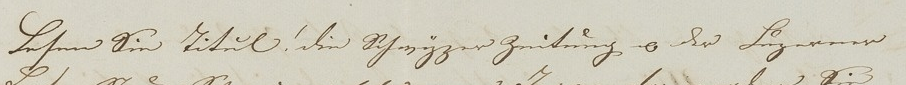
Lesen Sie Titul! die Schwyzer Zeitung & der Luzerner
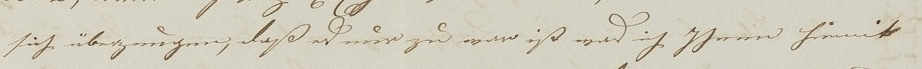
sich überzeugen, daß es nur zu war ist was ich Ihnen hiemit
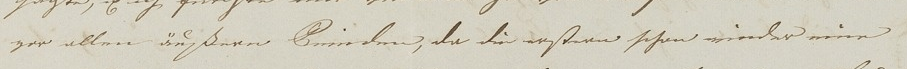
vor allen äußern Feinden, da die erstern schon wieder eine
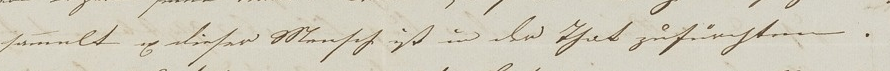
sammelt & dieser Mensch ist in der That zufürchten.
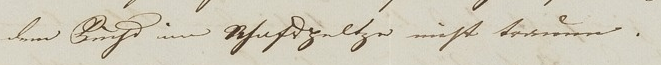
dem Fuchs im Schafspeltze nicht trauen. –
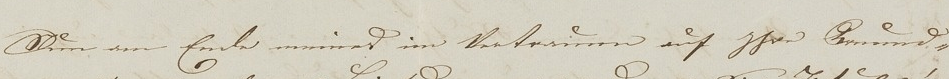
Nun am Ende meines im Vertrauen auf Ihre Freund-
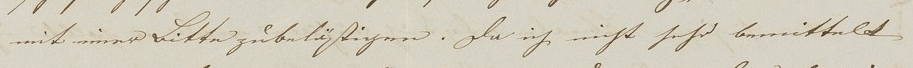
mit einer Bitte zubelästigen. Da ich nicht sehr bemittelt
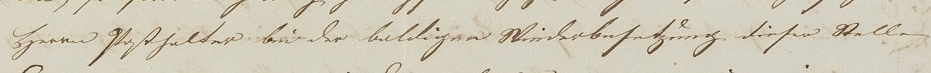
Herrn Posthalter bei der baldigen Wiederbesetzung dieser Stelle
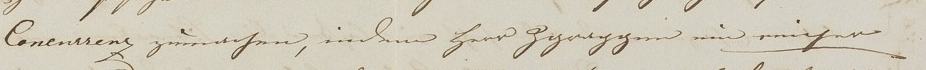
Concurrenz zumachen, indem Herr Zgraggen ein reicher
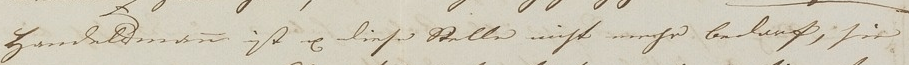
Handelsmann ist & diese Stelle nicht mehr bedarf; sie
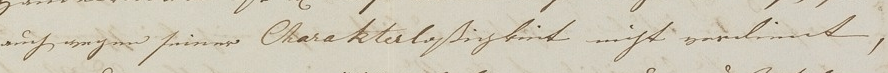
auch wegen seiner Charakterloßigkeit nicht verdient,
